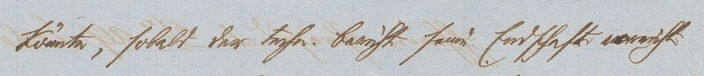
könnte, sobald der techn. Bericht seine Endschaft erreicht
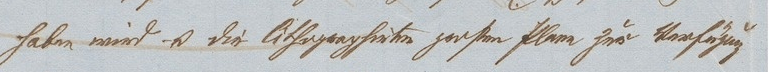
haben wird & die lithographirten großen Plane zur Verfügung
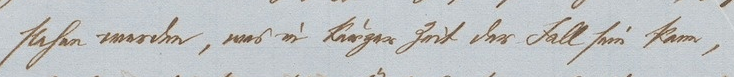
stehen werden, was in kurzer Zeit der Fall sein kann,
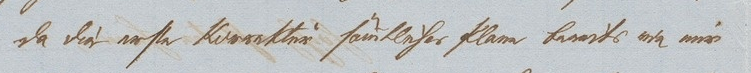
da die erste Korrektur sämmtlicher Plane bereits von uns
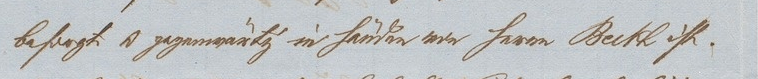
besorgt & gegenwärtig in Händen von Herrn Beckh ist.
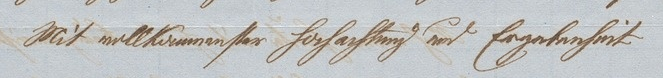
Mit vollkommenster Hochachtung und Ergebenheit
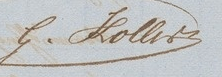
G. Koller
